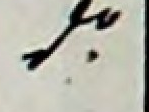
Do
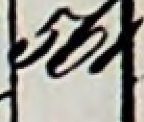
561
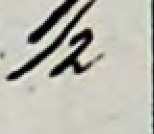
1/2
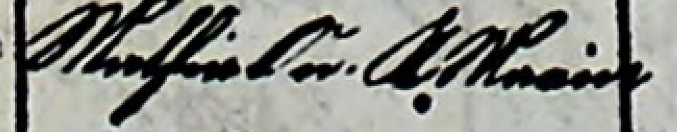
Mathias u. A Maria
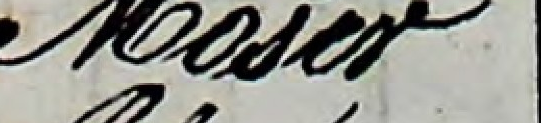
Moser
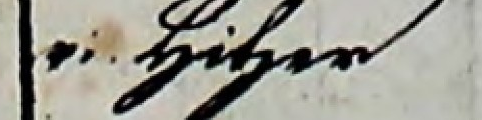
v. Hitzer
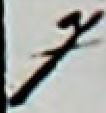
7
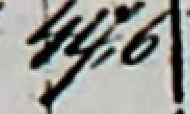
417,6
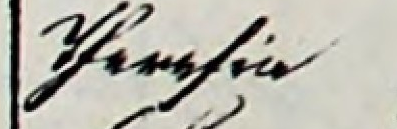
Theresia
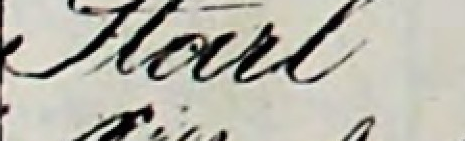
Starl
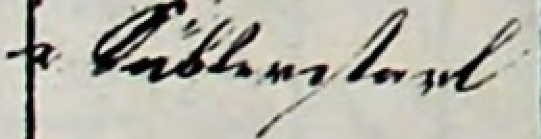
v. Küblerstarl
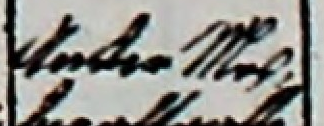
An der Mos„
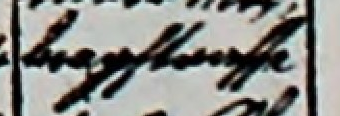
bergstrasse
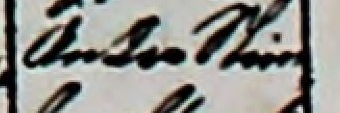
An der Stein„
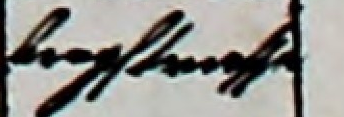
bergstrasse
